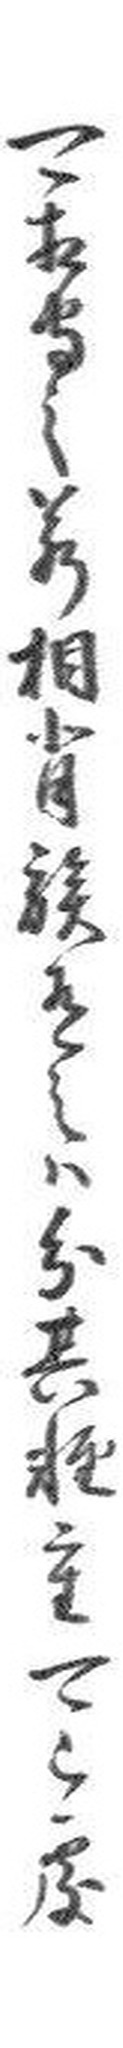可相守之若相背族有之ハ分其軽重可被処
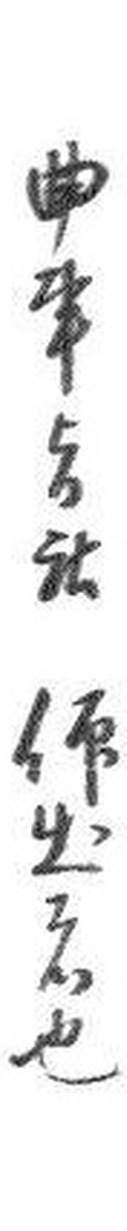曲事旨被仰出者也
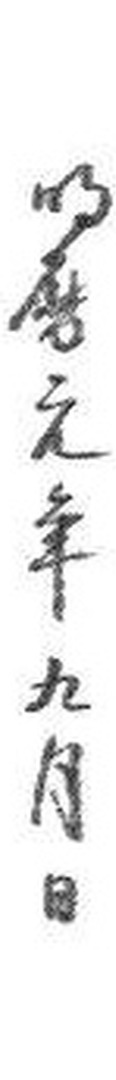明暦元年九月日

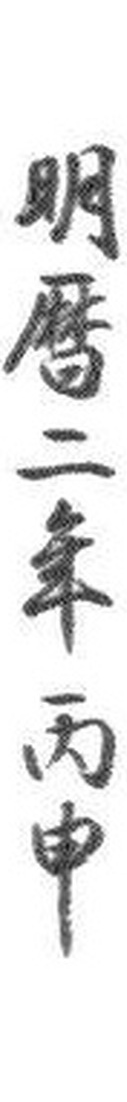明暦二年丙申
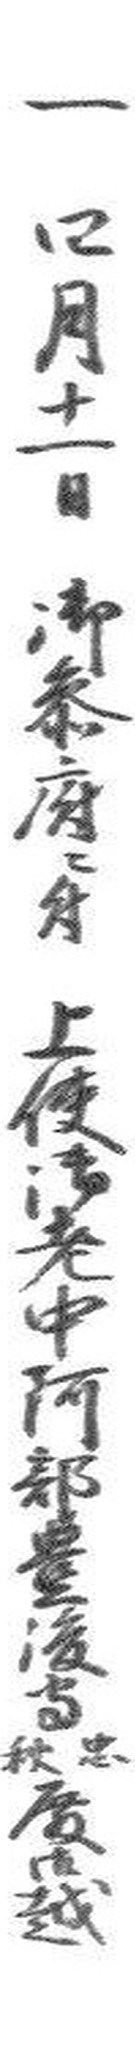一四月十一日御参府ニ付上使御老中阿部豊後守忠秋殿御越
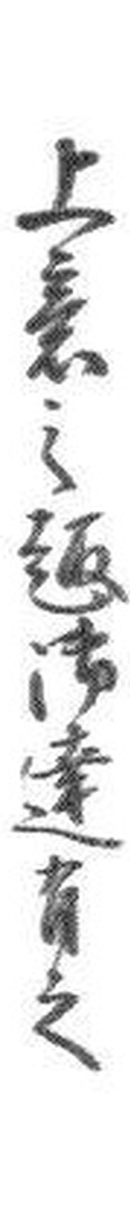上意之趣御達有之
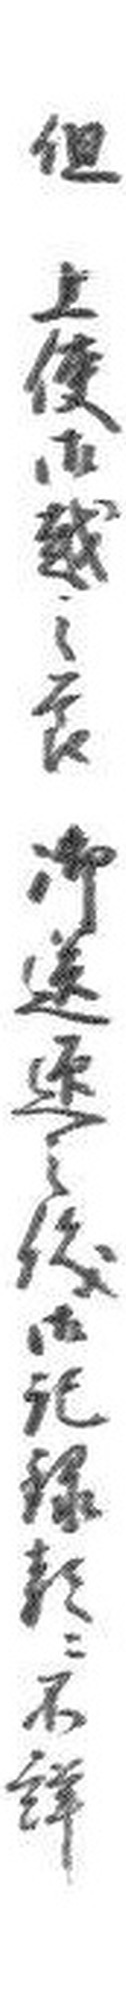但上使御越之節御送迎之儀御記録類ニ不詳
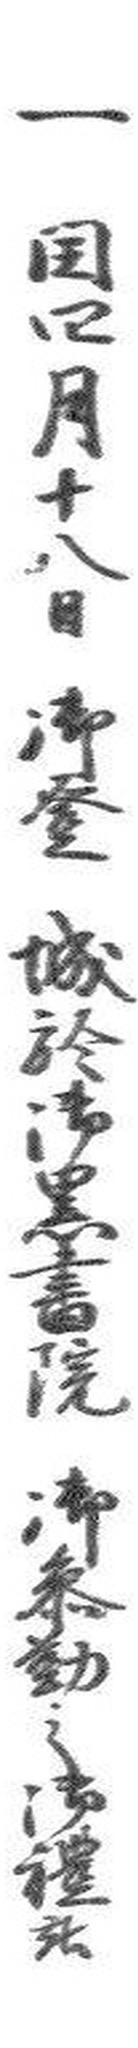一閏四月十八日御登城於御黒書院御参勤之御礼被

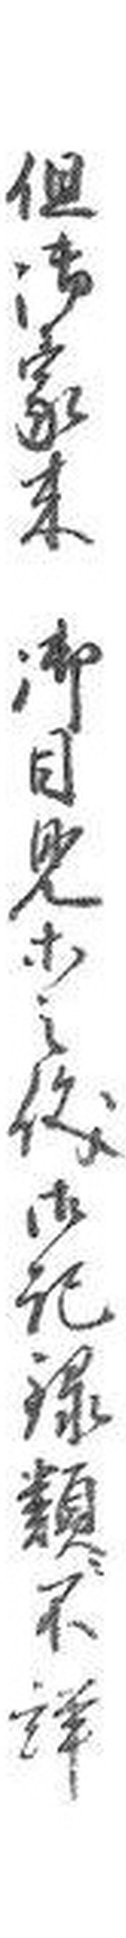但御家来御目見等之儀御記録類ニ不詳
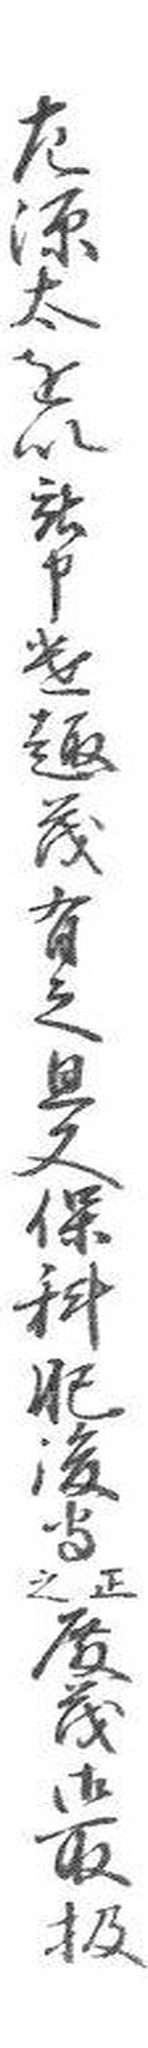左源太を以被申遣趣も有之且又保科肥後守正之殿も御取扱
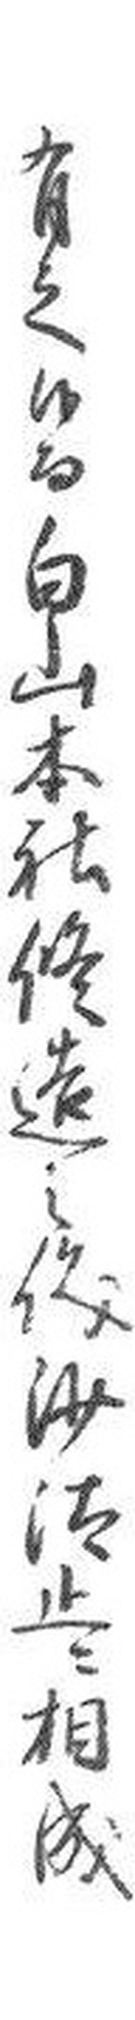有之候而白山本社修造之儀沙汰止ニ相成
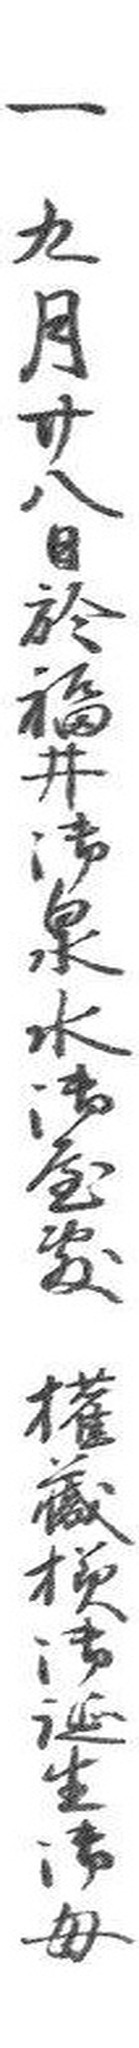一九月十八日於福井御泉水屋敷権蔵様御誕生御母
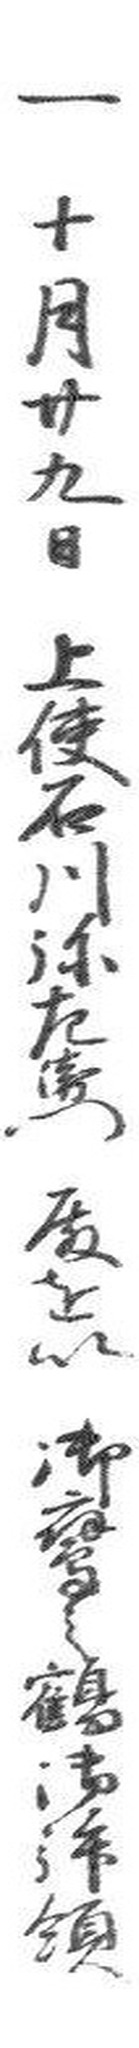一十月廿九日上使石川弥左衛門殿を以御鷹之鶴御拝領
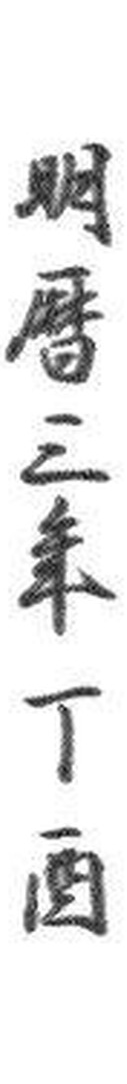明暦三年丁酉
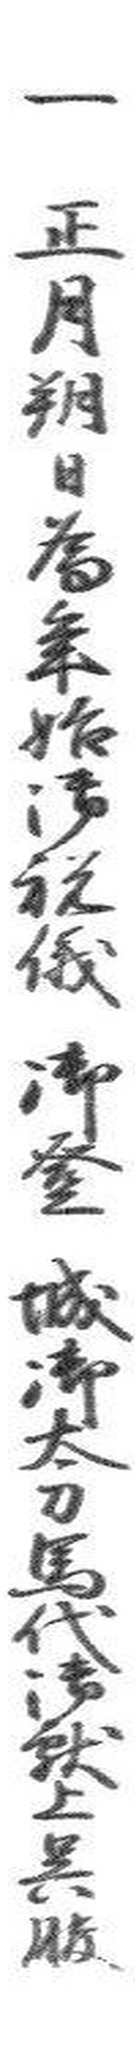一正月朔日為年始御祝儀御登城御太刀馬代御献上呉服
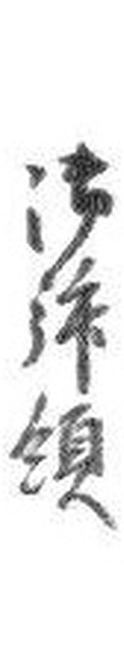御拝領
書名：家譜 五 光通公 従寛永十三年到万治二年
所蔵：福井県文書館 Fukui Prefectural Archives
